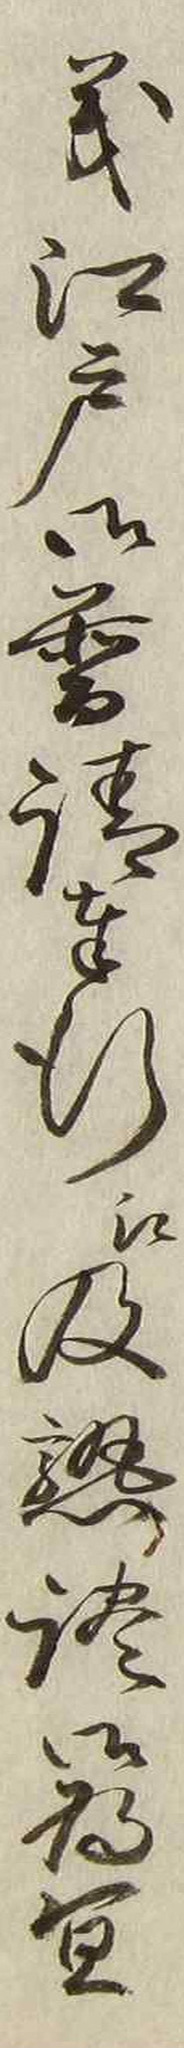義江戸御普請奉行江及熟談御為宜
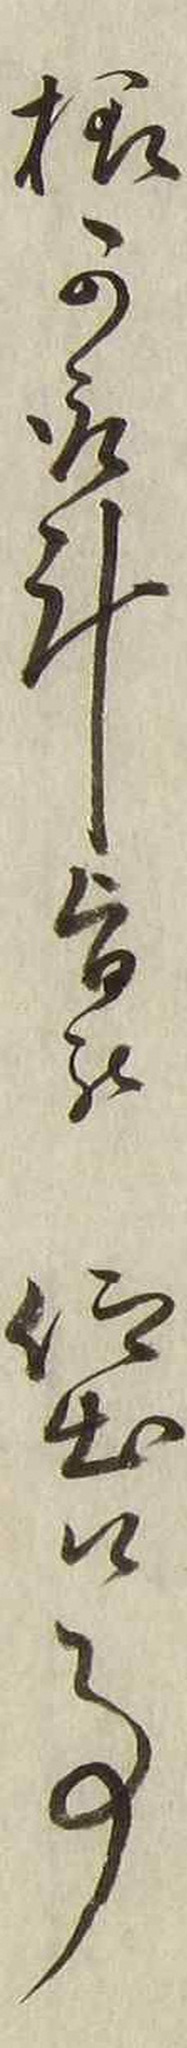様可取計旨被仰出候事

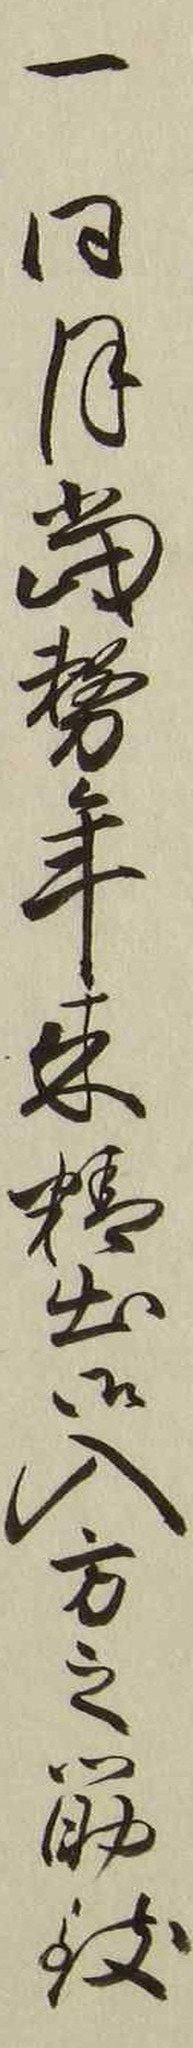一同月当務年来精出御入方之筋致
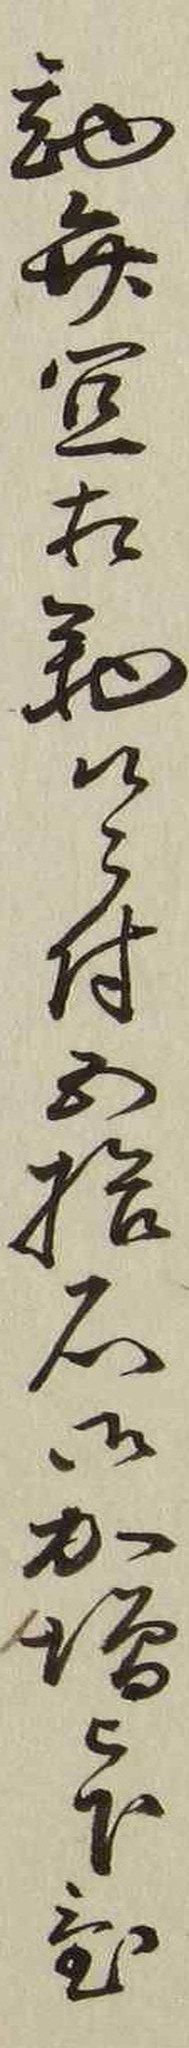勘弁宜相勤候ニ付五拾石御加増被下置
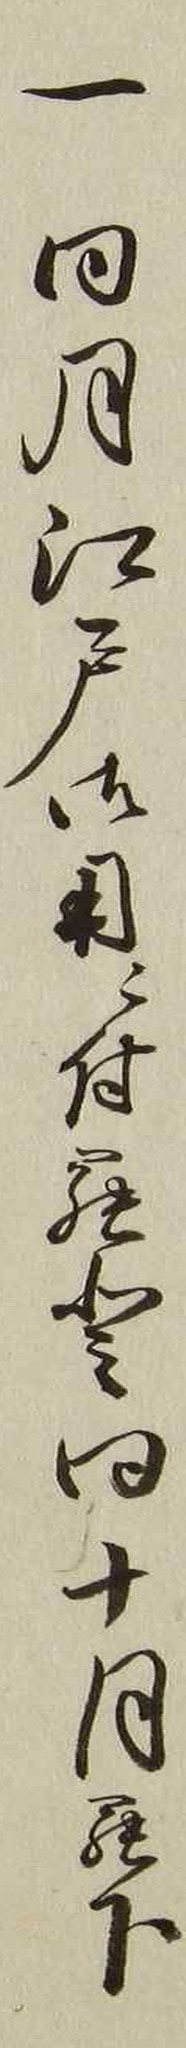一同月江戸御用ニ付罷登同十月罷下
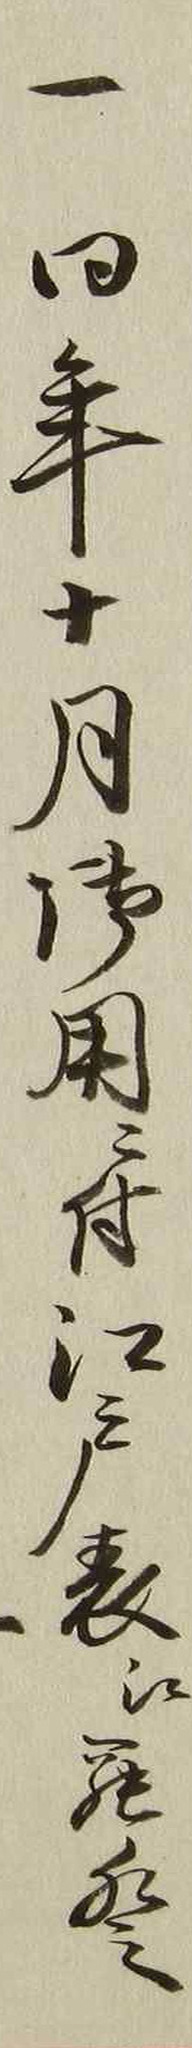一同年十月御用ニ付江戸表江罷登
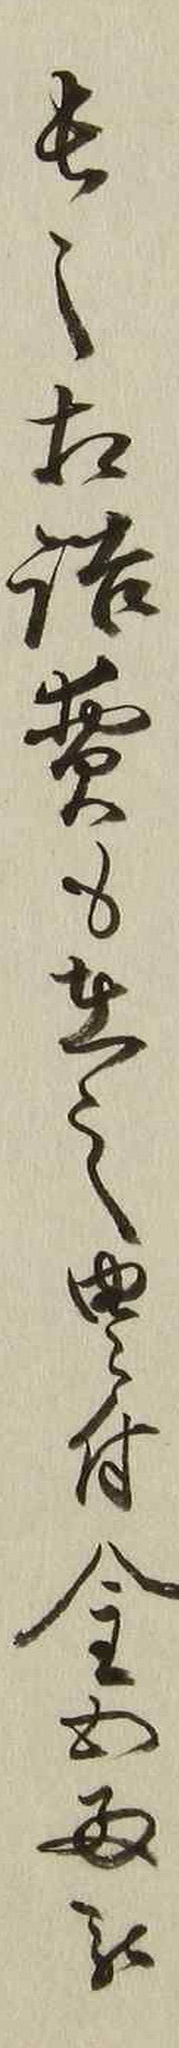長之相詰費も在之由ニ付金五両被
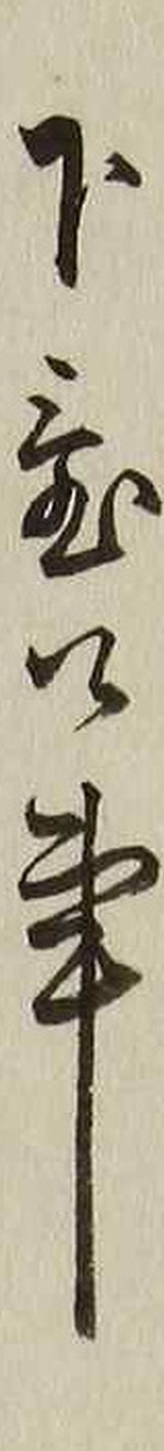下置候事
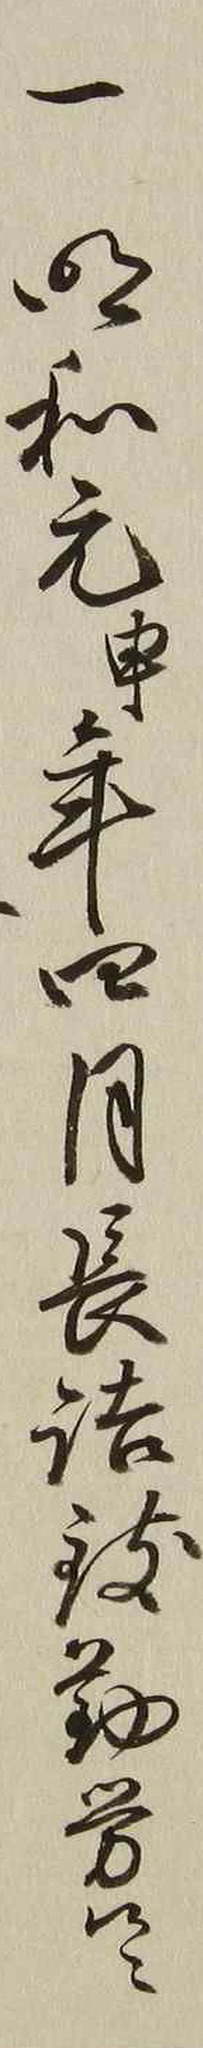一明和元申年四月長詰致勤労候ニ
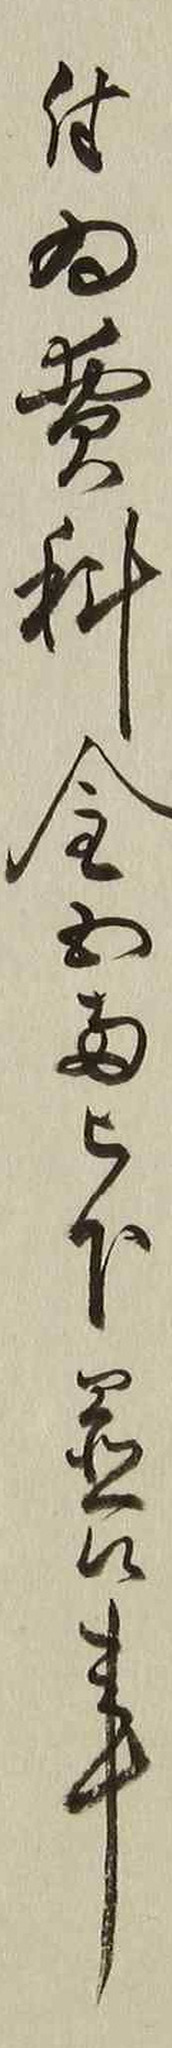付為費科金五両被下置候事
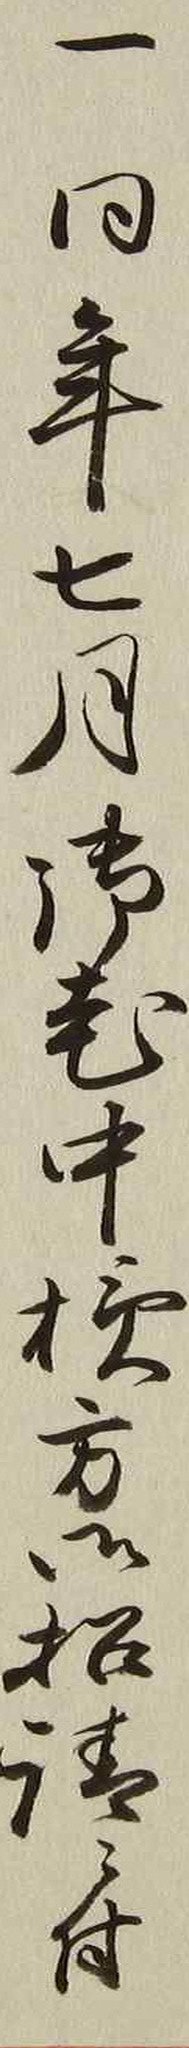一同年七月御老中様方御招請ニ付
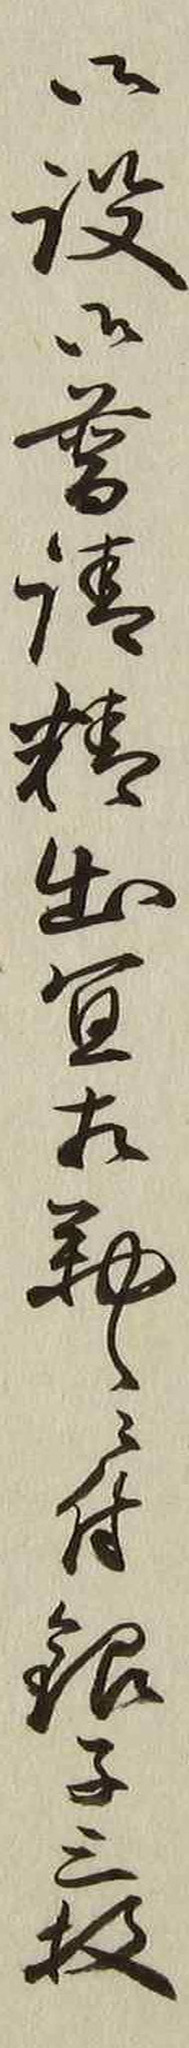御設御普請精出宜相勤候ニ付銀子三枚
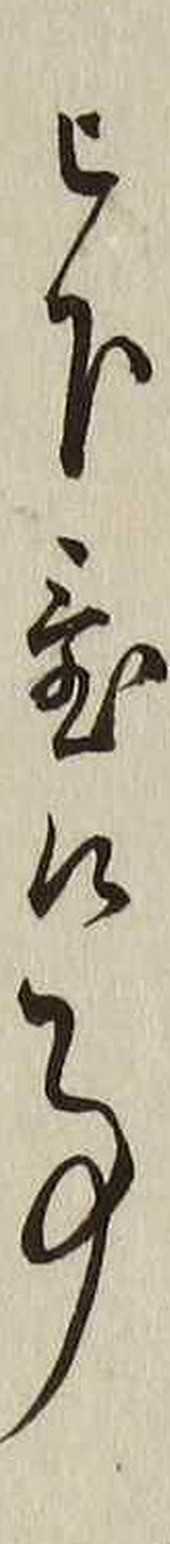被下置候事
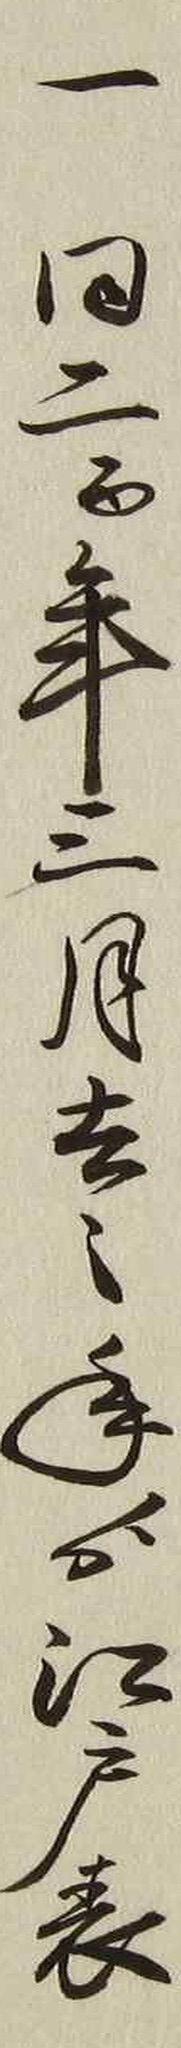一同二酉年三月去々年ゟ江戸表
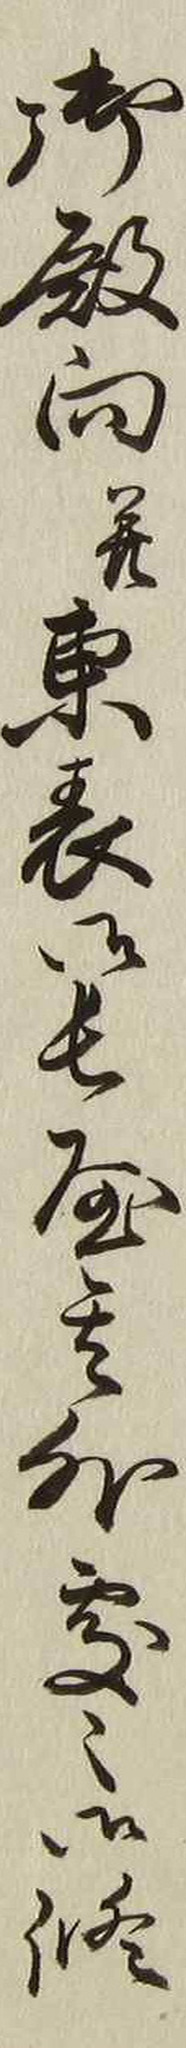御殿向并東表御長屋其外処々御修
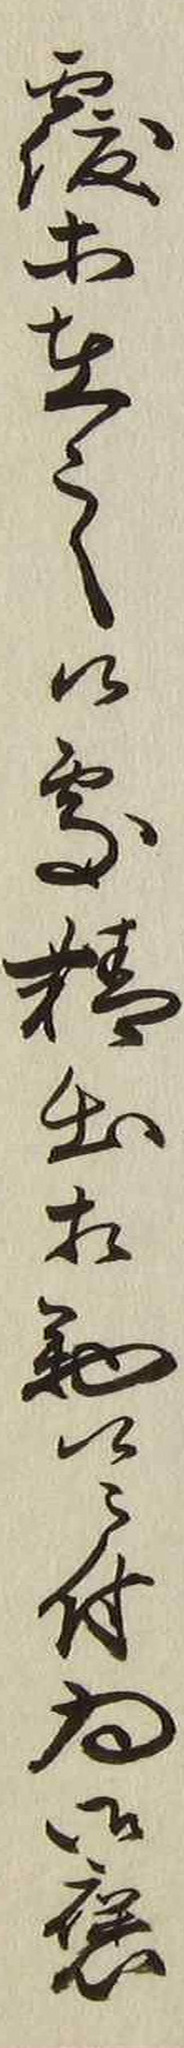覆等在之候処精出相勤候ニ付為御褒
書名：諸士系譜　巻之21　い之部21
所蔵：会津若松市立会津図書館
